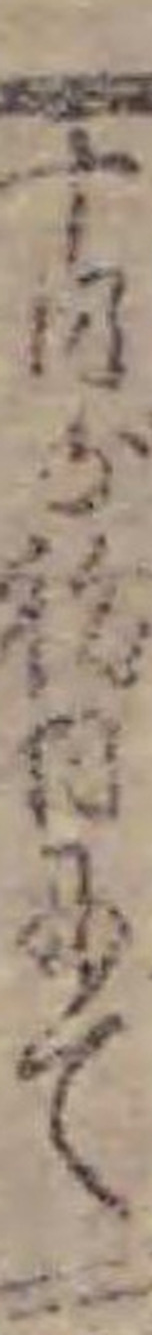十日が日にて
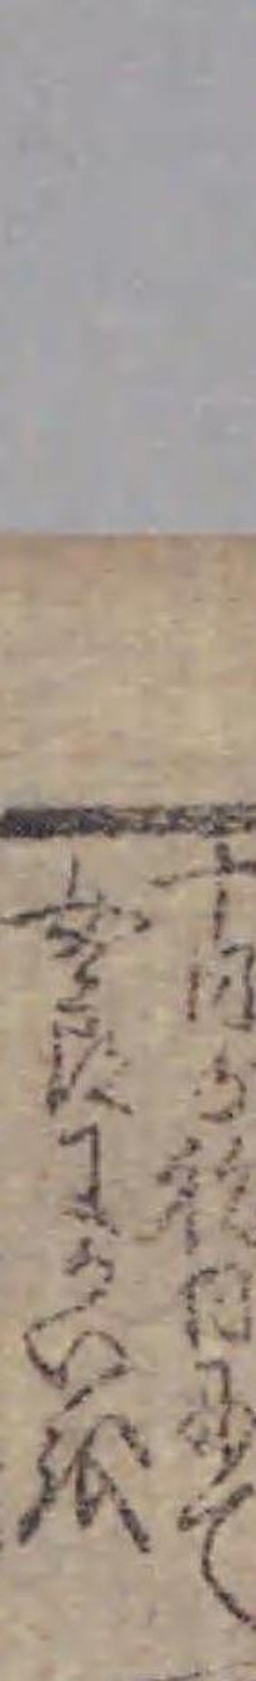女郎にかいを
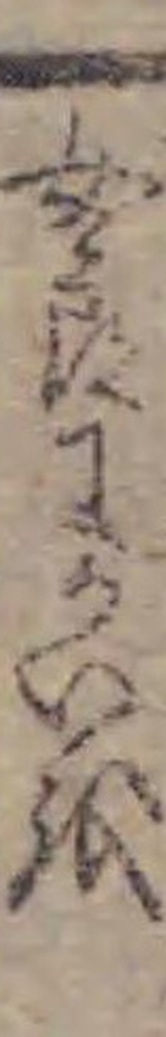女郎にかいを
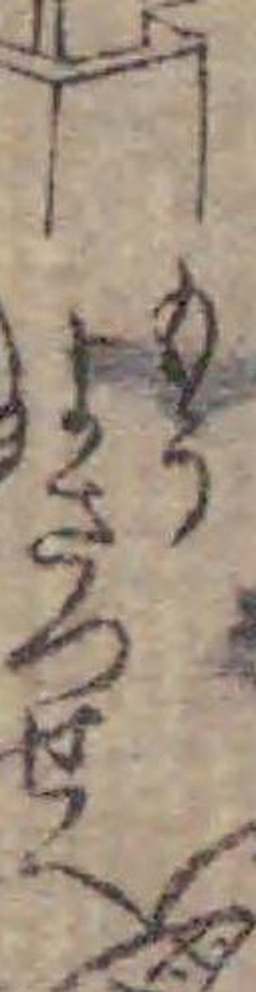よさつせへ
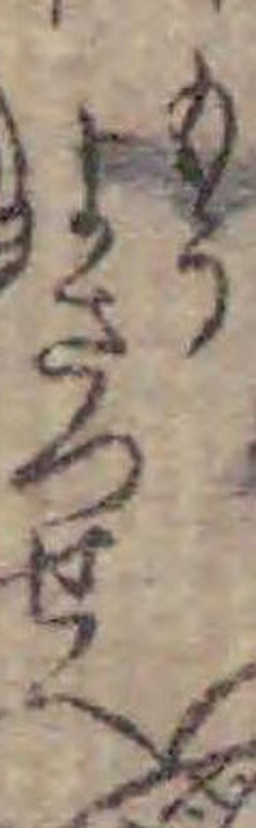よさつせへ
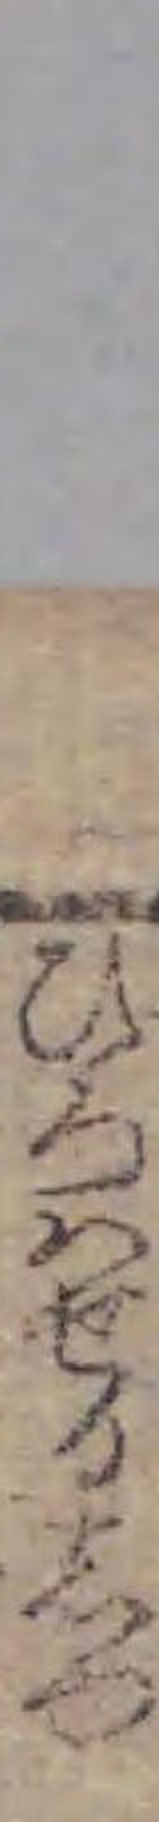ひろはせるしゆ
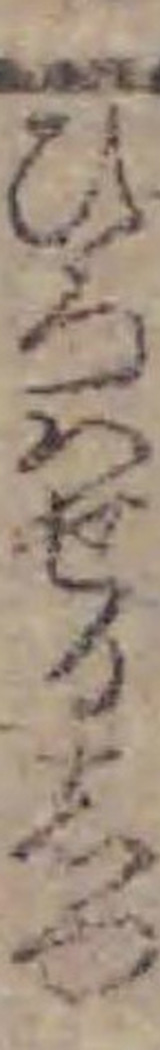ひろはせるしゆ
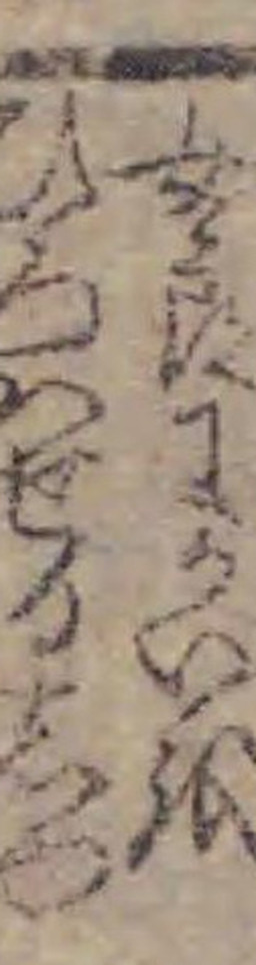ひろはせるしゆ
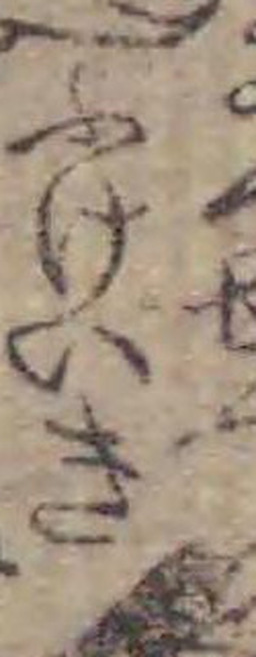ふけいき
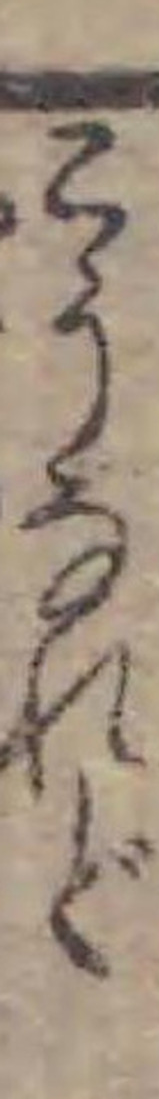こうなれど
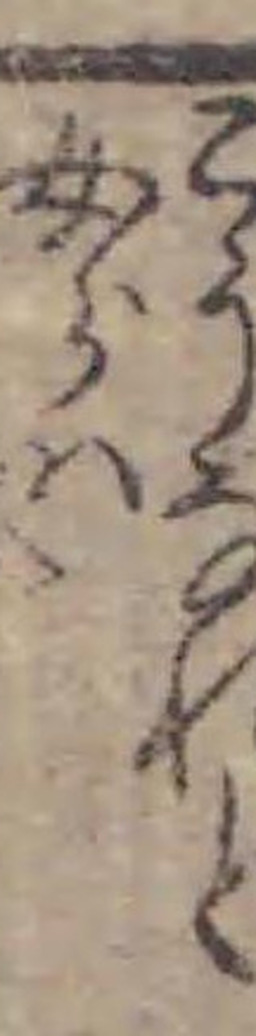女郎は
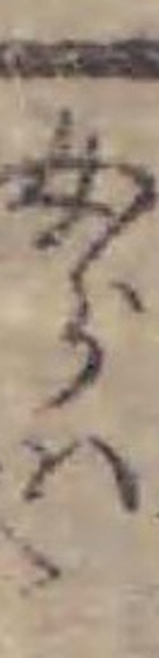女郎は
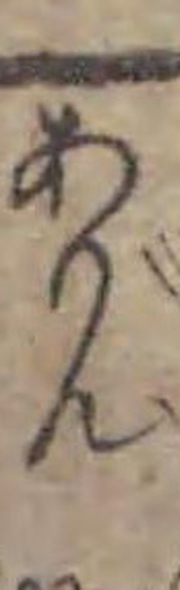ありん
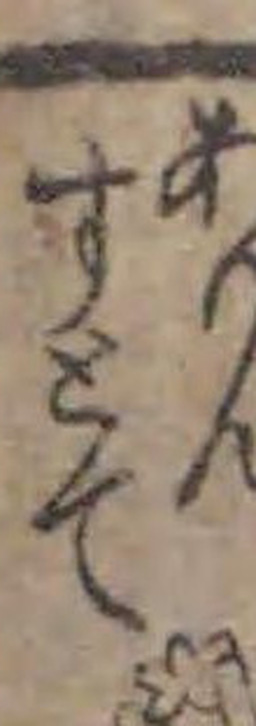すとて
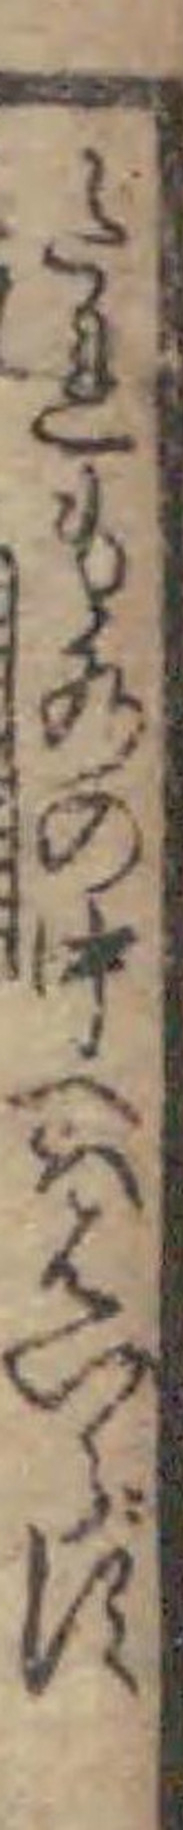たれも水の中へはいらず
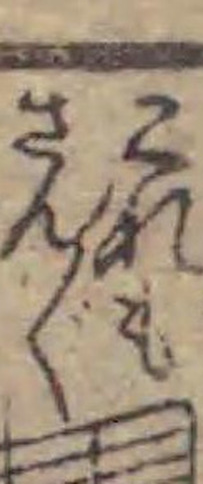さん〴〵
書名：本樹真猿浮気噺 : 3巻
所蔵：国立国会図書館 National Diet Library, JAPAN
